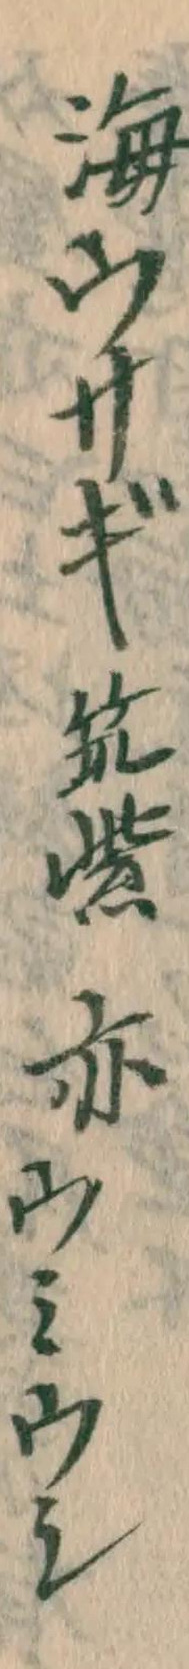海ウサギ筑紫亦ウミウシ
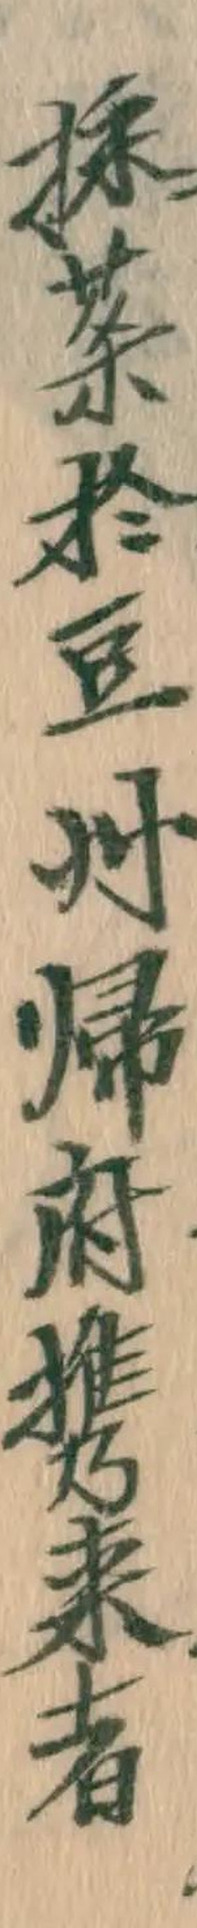採薬於豆州帰府携来者

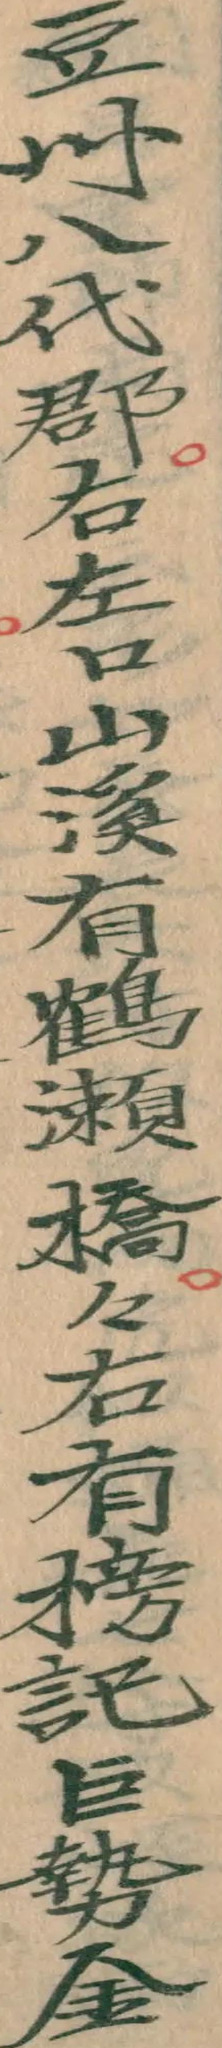豆州八代郡。右左口山渓有鶴瀬橋。々右有榜記巨勢金
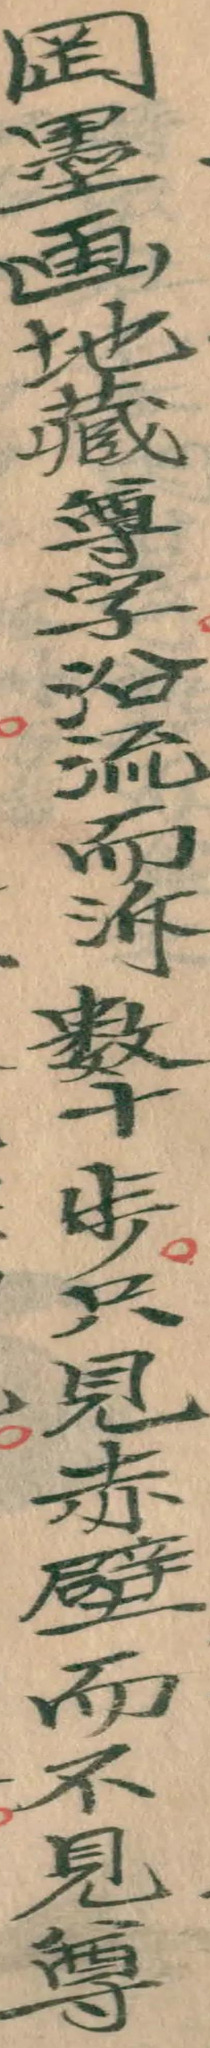岡墨画地藏尊字。沿流而泝数十歩。只見赤壁而不見尊
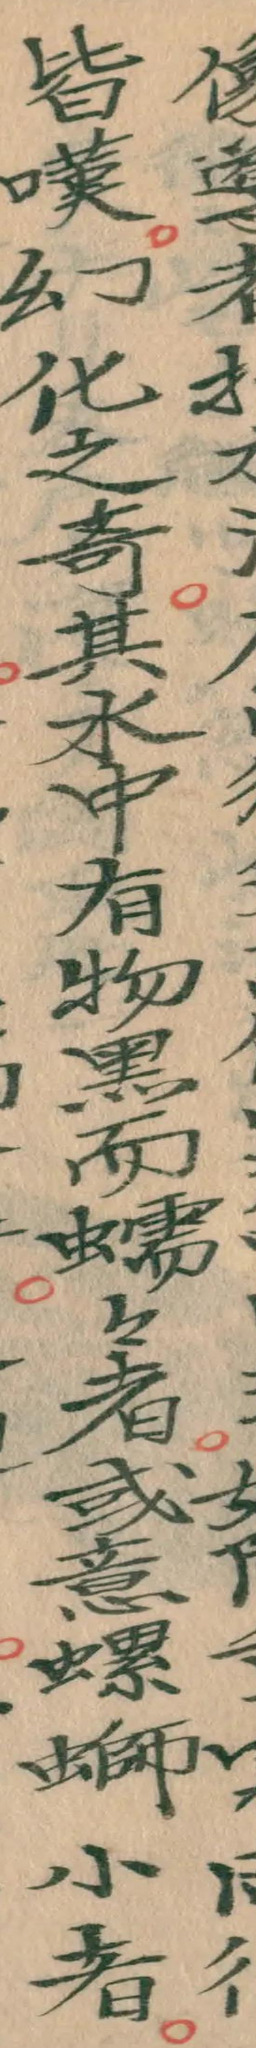皆嘆。幻化之奇。其水中有物黑而蠕々者。或意螺螄小者。
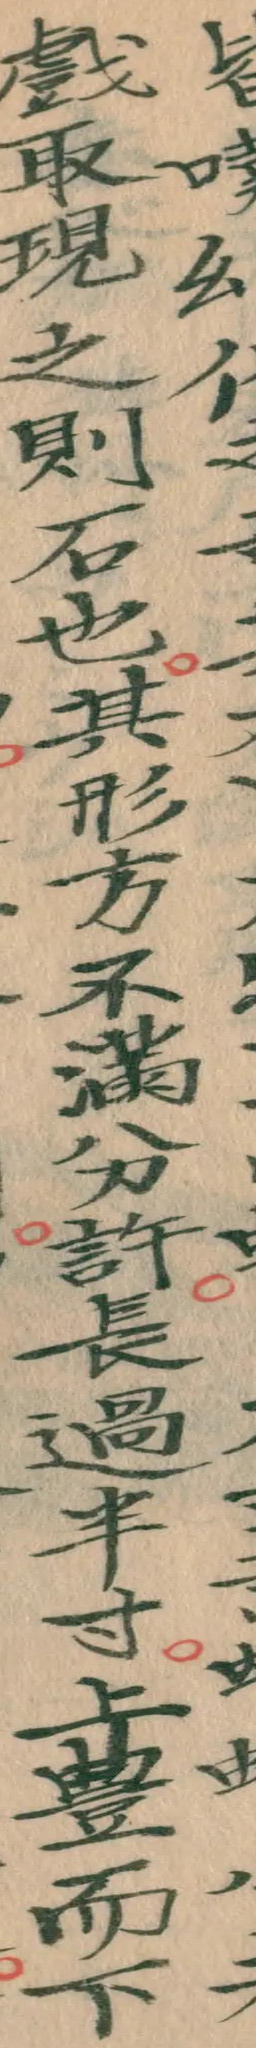戲取現之則石也。其形方不満分許。長過半寸。上豊而下
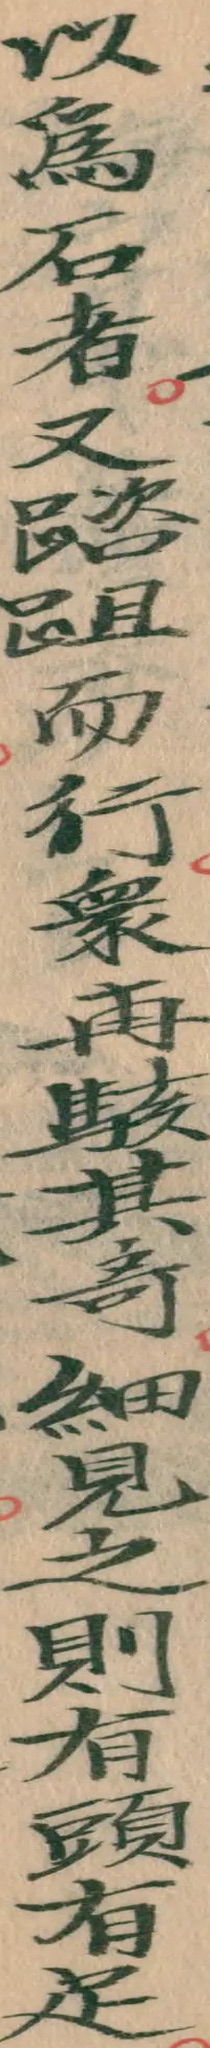以為石者。又䠖跙而行。衆再駭其奇。細見之則有頭有足。
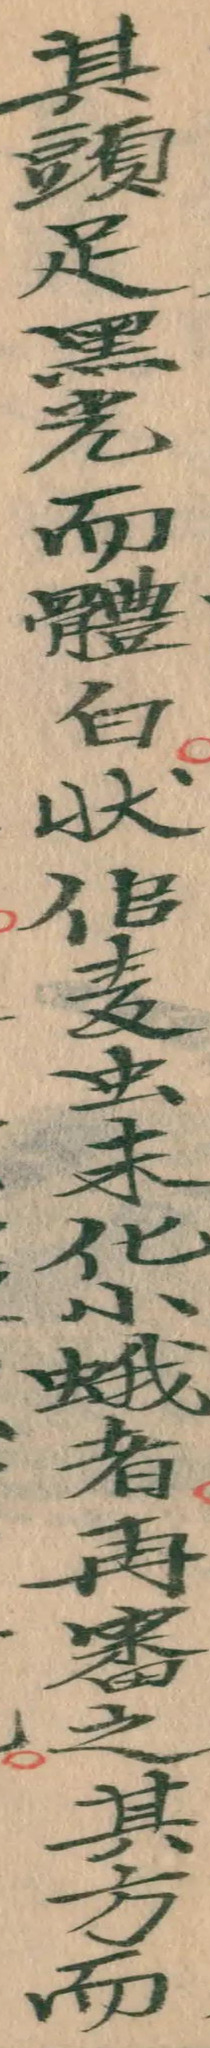其頭足黑光而體白。状佀麦虫未化小蛾者。再審之其方而
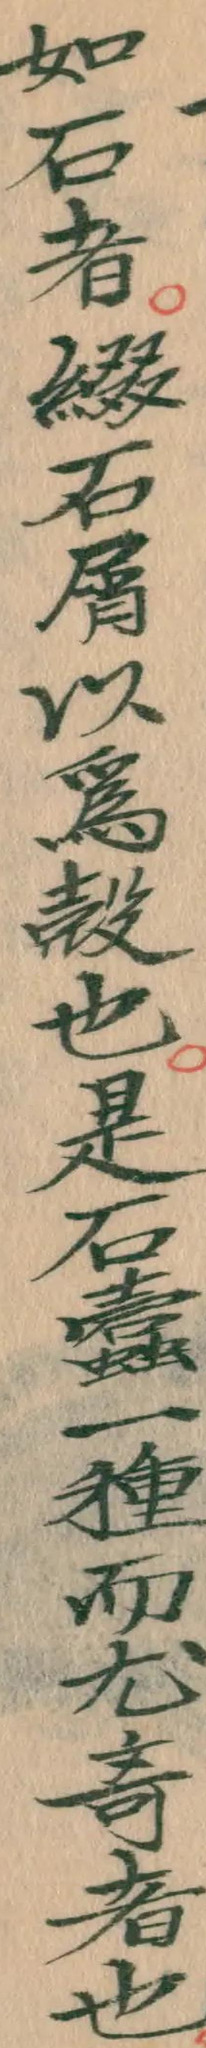如石者。綴石屑以爲殻也。是石蠹一種而尤奇者也。
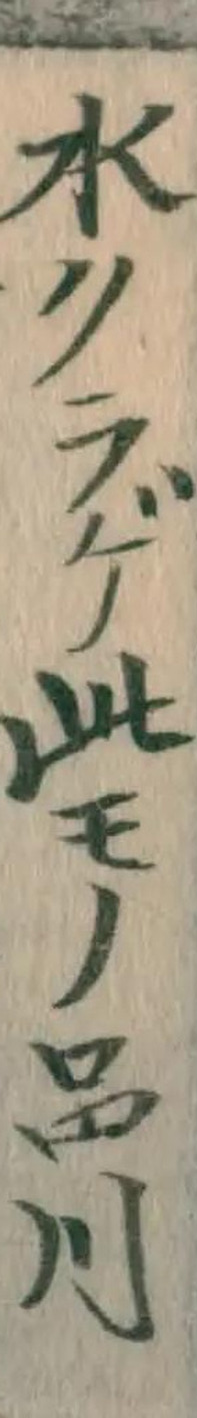水クラゲ此モノ品川
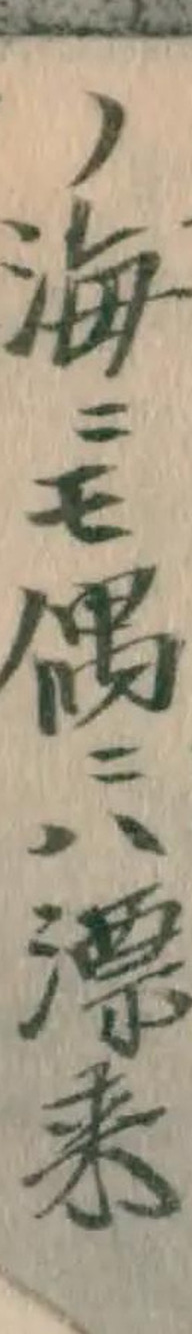ノ海ニモ偶ニハ漂来
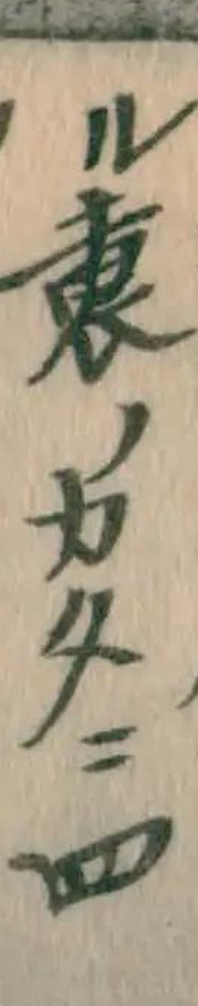ル裏ノカタニ四
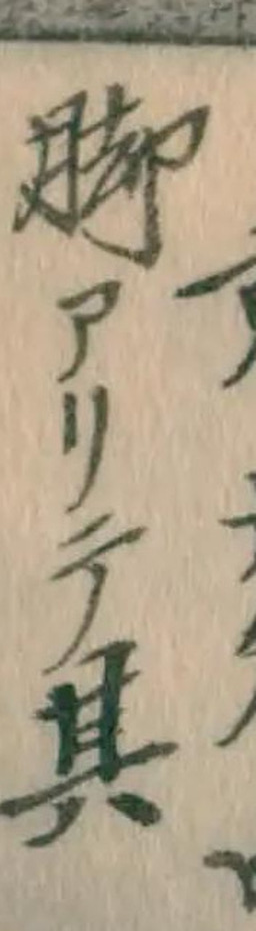脚アリテ其
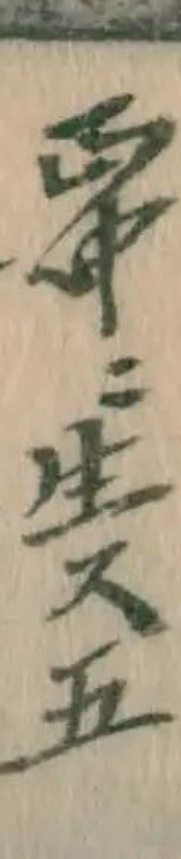正中ニ生ス五
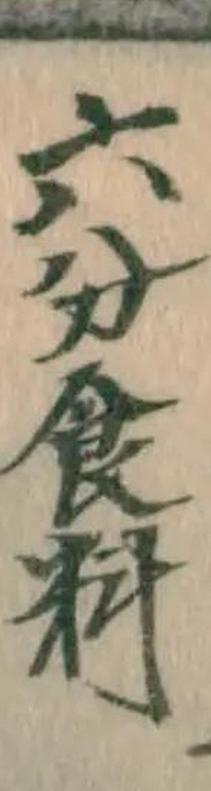六分食料
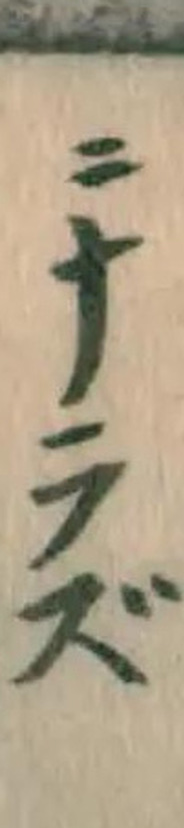ニナラズ
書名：千蟲譜 3巻. [1]
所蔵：国立国会図書館 National Diet Library, JAPAN
